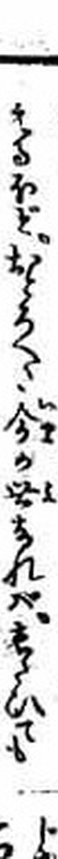えるなどおとろへた今の世なればしたひても順
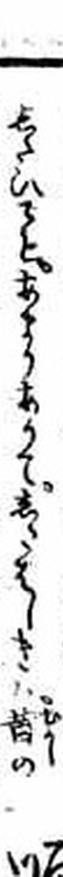したひてもあまりありてしたはしきは昔の
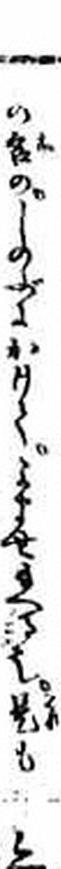の名のしのぶにかけてよませ給へる也是も徳
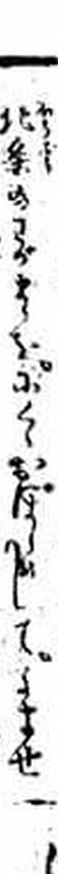北條のわがまゝをにくゝおぼしめしてよませ
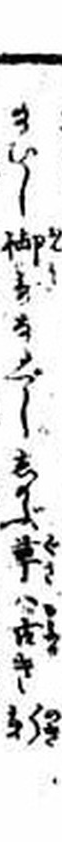給ひし御哥なるべししのぶ草は古き軒
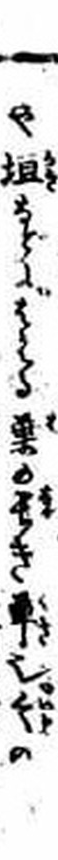や垣などにはえる葉のながき長き草也今の院
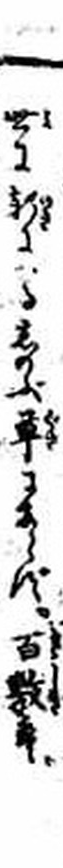世に軒にはるしのぶ草にあらず百敷は
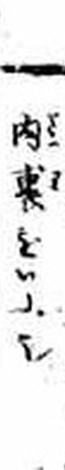内裏をいふ也
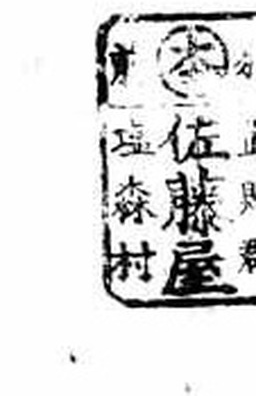前塩森村
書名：小倉百人一首
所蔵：東京学芸大学教育コンテンツアーカイブ
